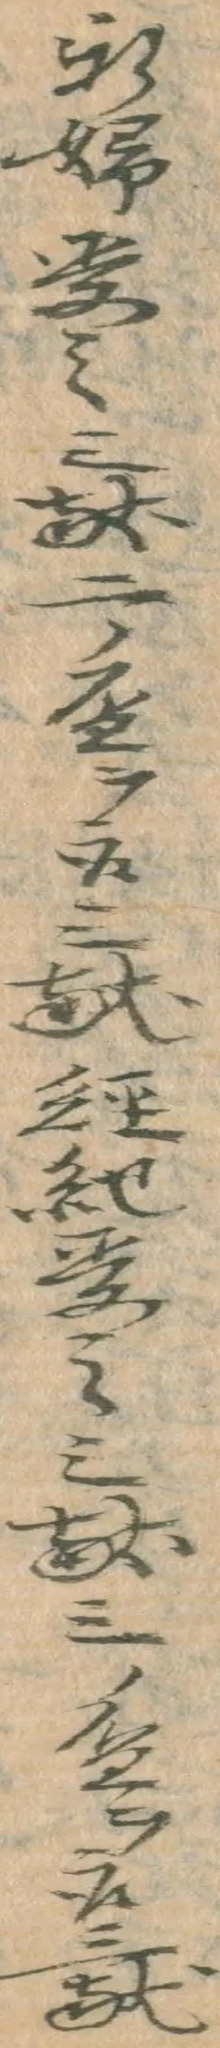新婦受之三献二ノ置ヲ取三献経紀学之ミ献三ノ盃ヲ取三献
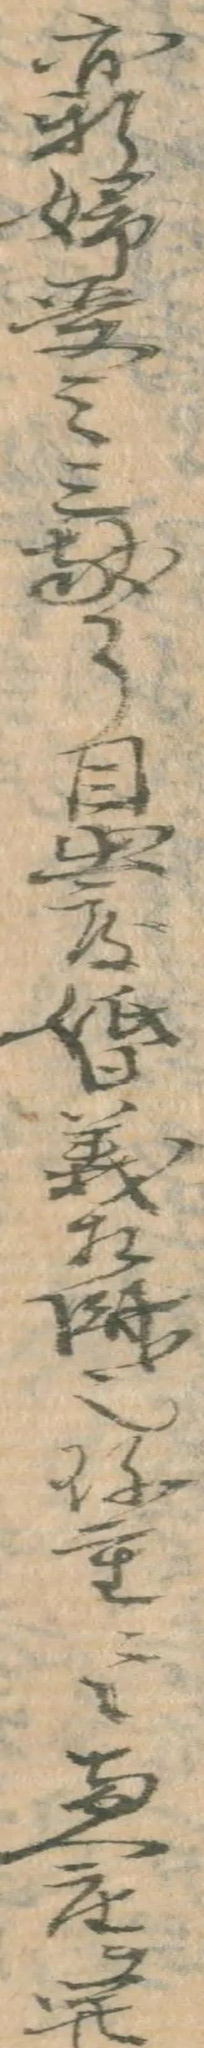亦新婦取之三献了目出度婚義相済也弥重々々両人座ヲ開
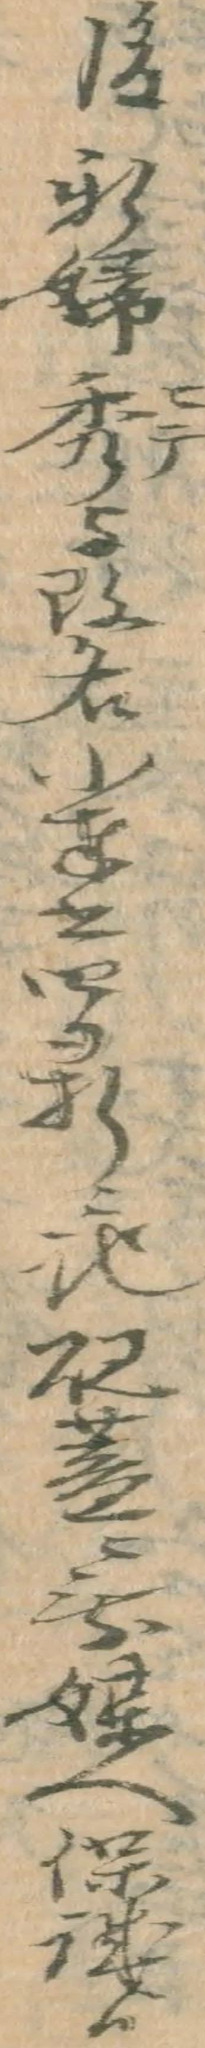後新帰秀与改名小奉書四ツ折ニ記硯蓋ニ乗媒人保誠ニ
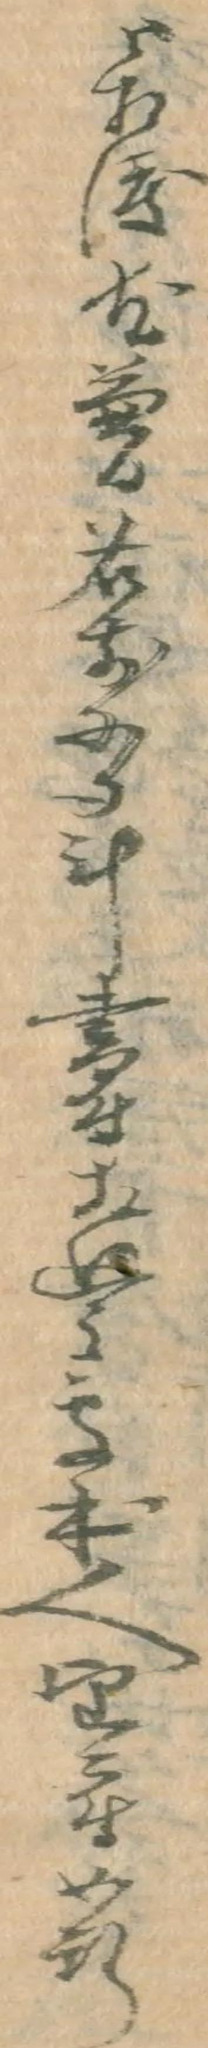被相渡尤兼日名前五ツ斗書付相廻り處本人望ニ付如斯

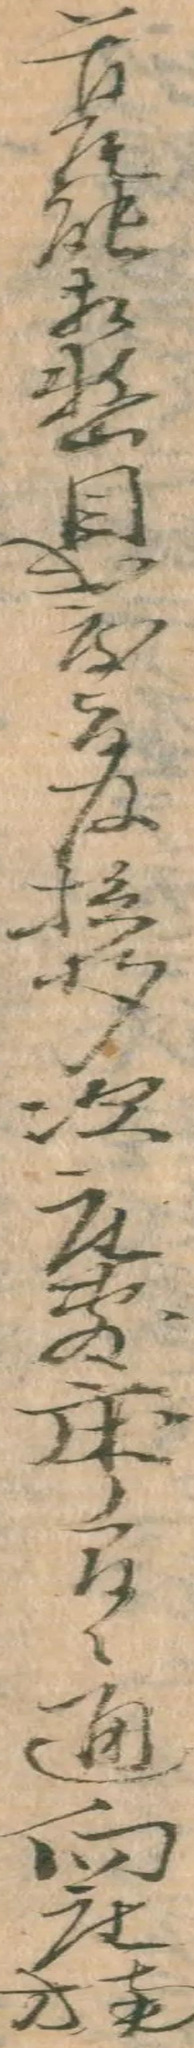首尾能相整目出度旨及挨拶候次屋敷床ノ間之通向座南方
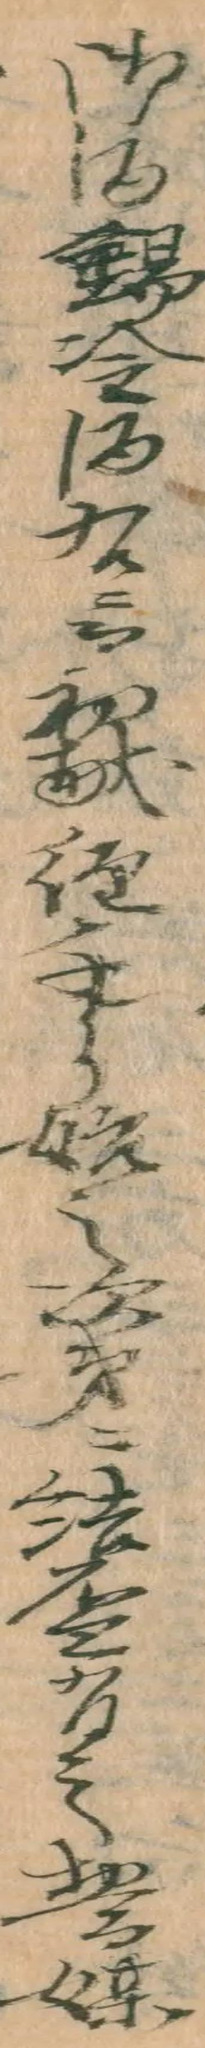御酒錫冷酒右二而初献経千より始之次第二結盃有之惣而媒
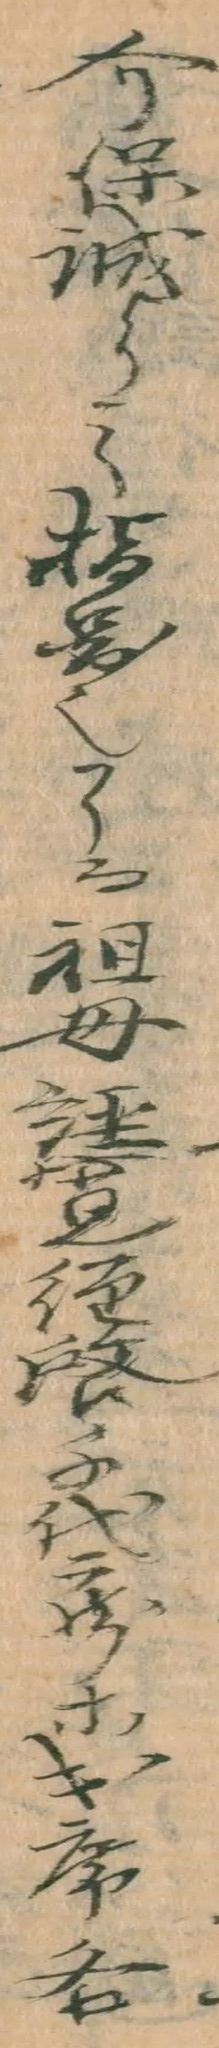介保誠より之指図也了而祖母経寛経啓千代蔵等出席各
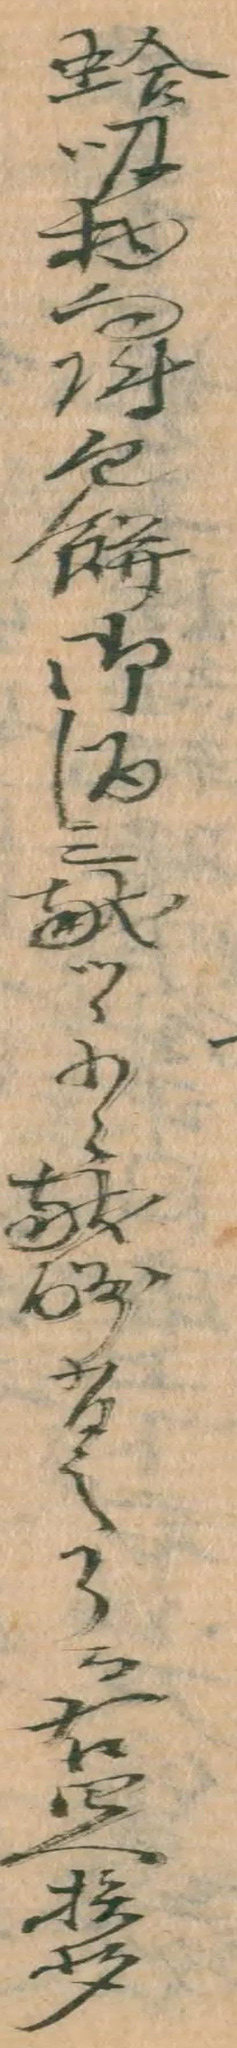蛤吸物向附包餅御酒三献ツヽ少々献有之了而右四人挨拶
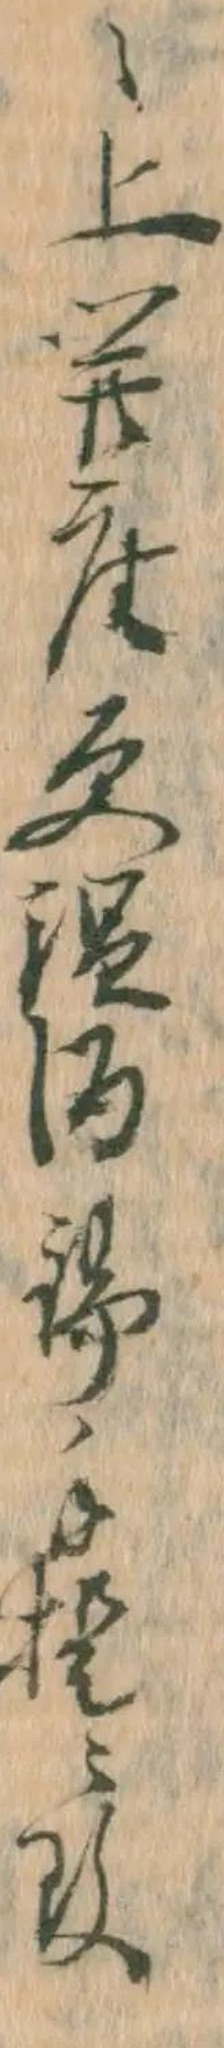之上開座受温酒錫手堤ニ改
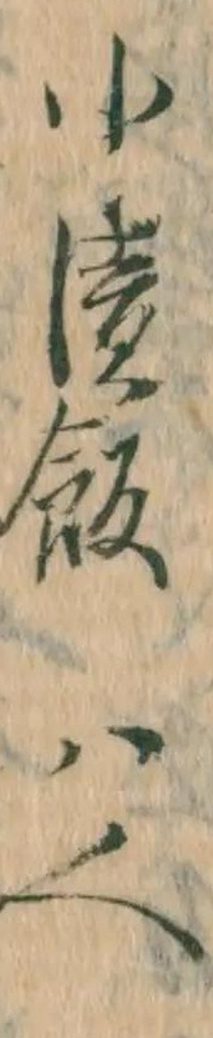小漬飯八人
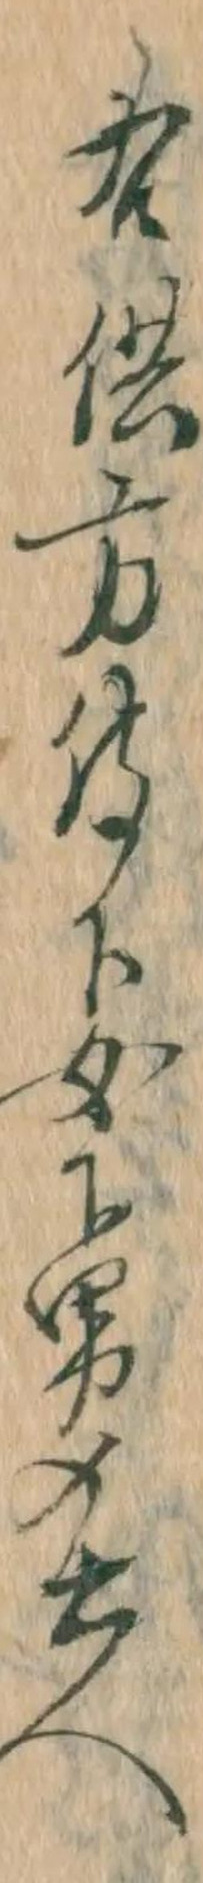右供方侍下女下男〆七人
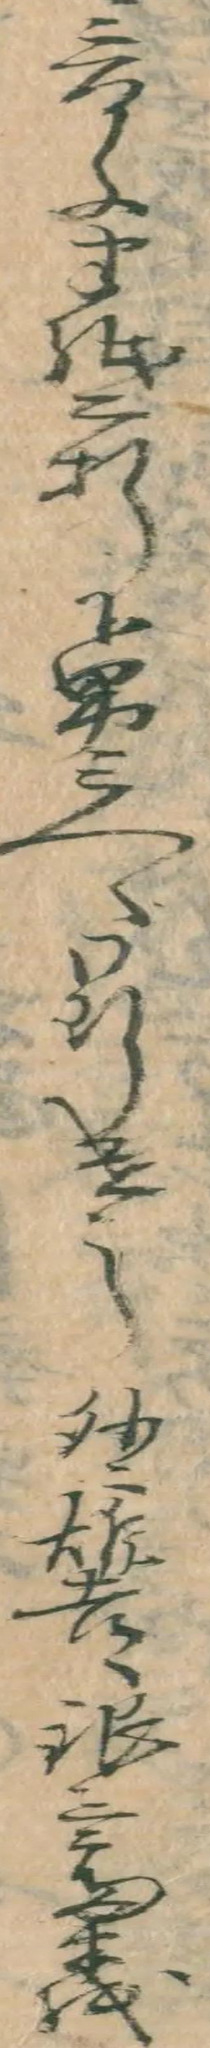三百文半紙二折下男三人へ同断遣也外に雄吉へ銀壱匁半紙
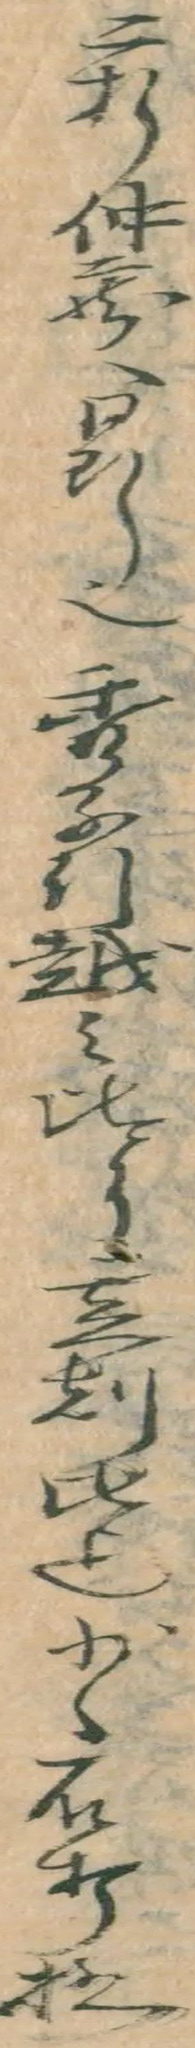二折仲蔵へ同断也秀子引越の比より亥刻比迄少々石打松

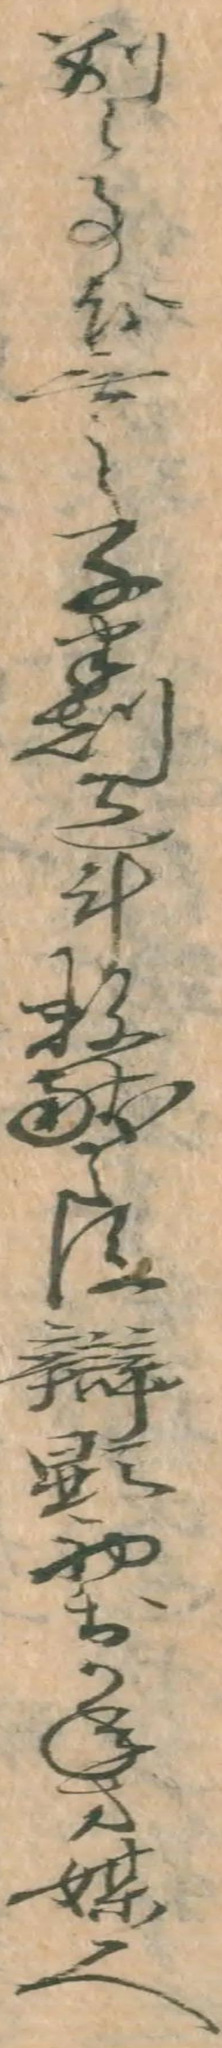判之事も無之子半刻過斗数献之後辨顕初おかね方媒人
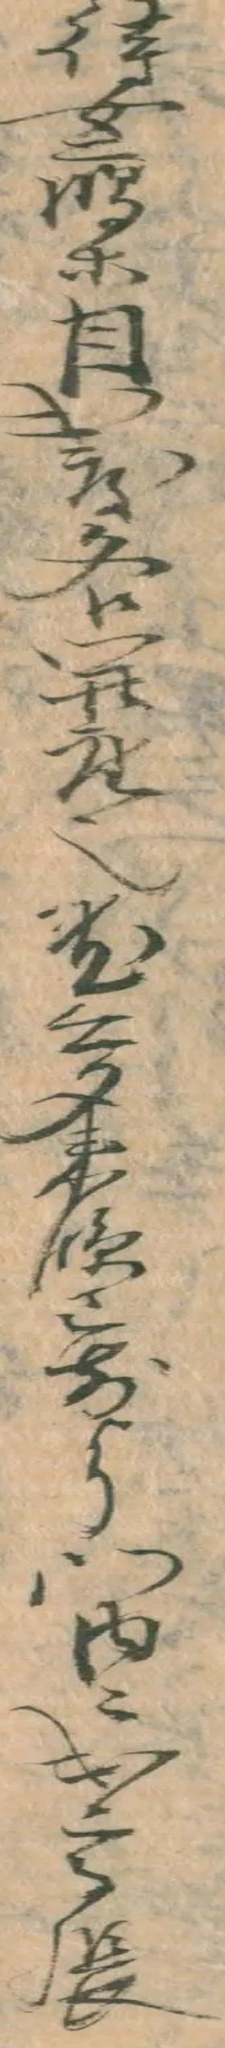待女臈等目出度各開座也尤今夕未已前より門内ニ出高張
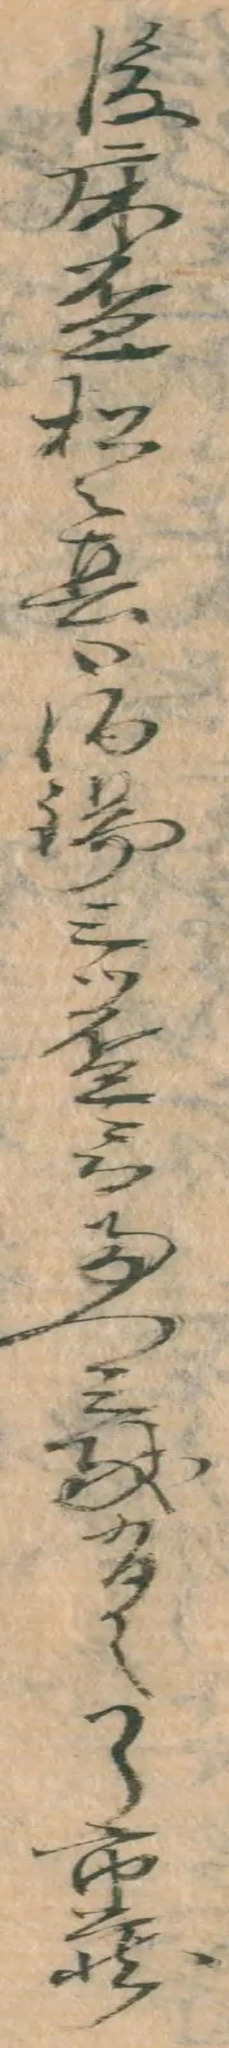後床盃松之其御酒湯三ツ盃ニ而両人三献有之了市蔵
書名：賀茂社記録. 第69冊
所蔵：国立国会図書館 National Diet Library, JAPAN
